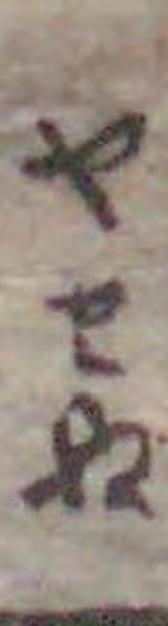やせぬ
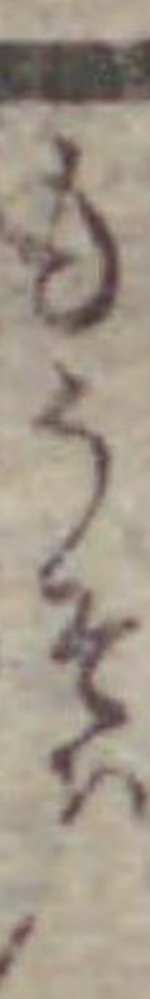もうそは
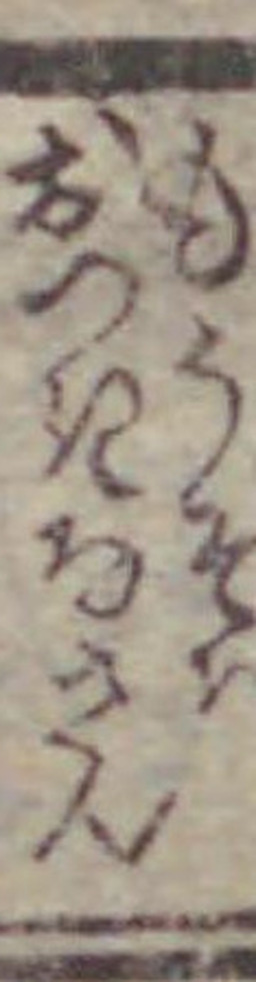おつきなさん
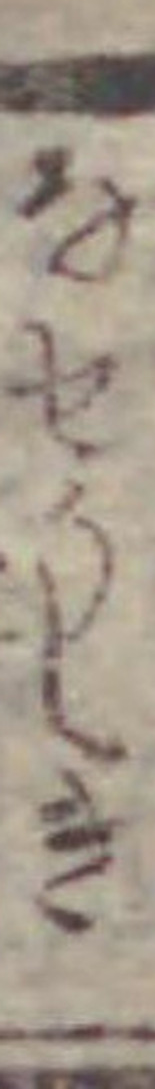なせうしき
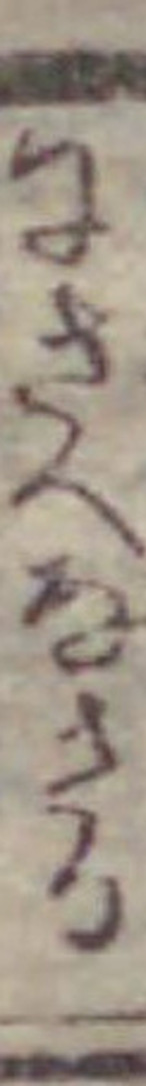にさへなさる
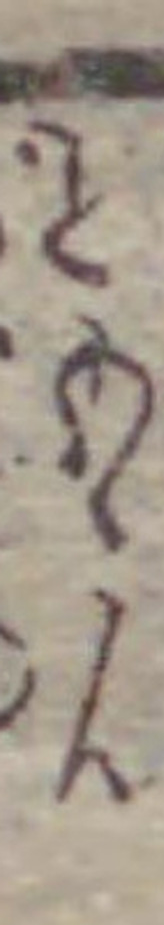ともゝん
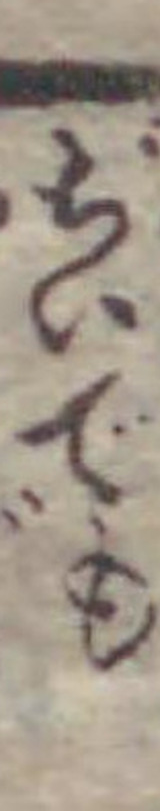ぢいでも
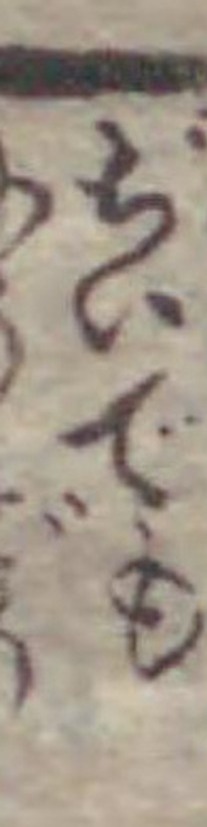ぢいでも
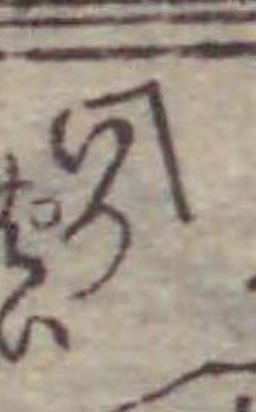〽いつ
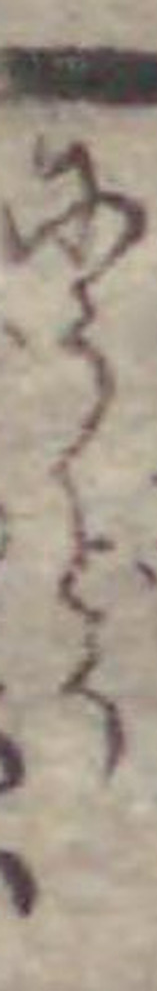にうどう
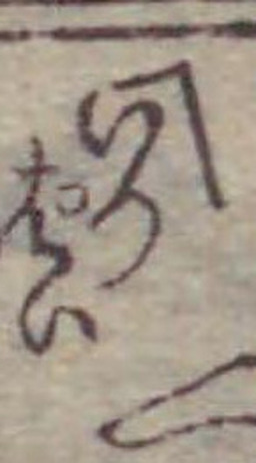〽いつ
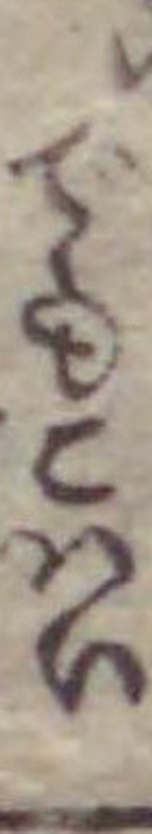でもこはい
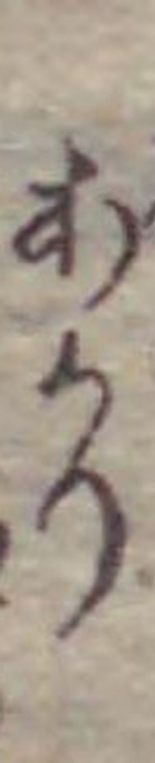あかり
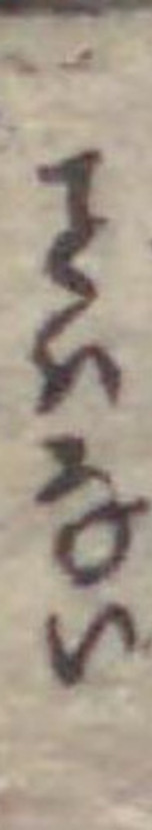ことはない
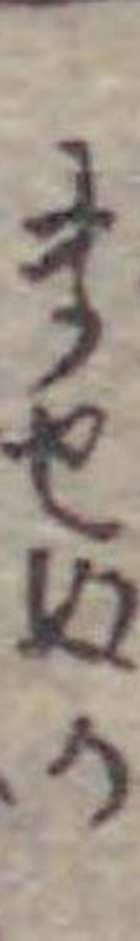ませぬか
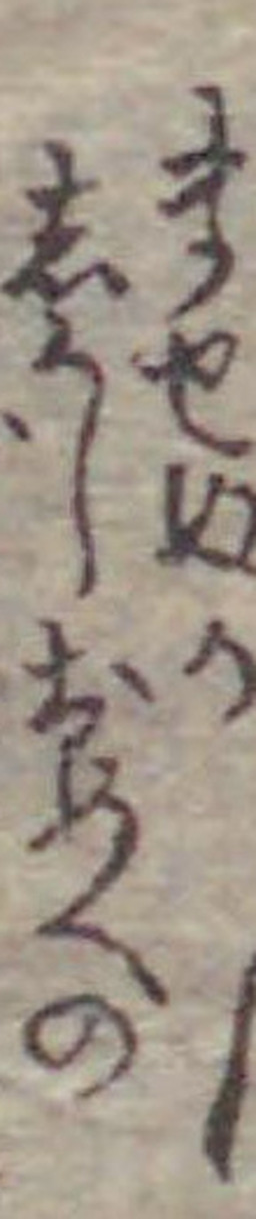しかしおめへの
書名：化物見世開 : 2巻
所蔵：国立国会図書館 National Diet Library, JAPAN
